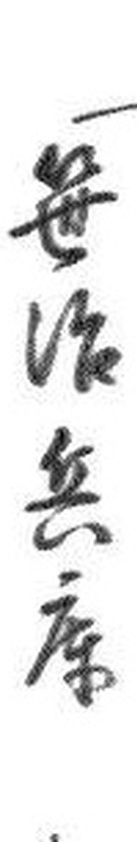笹治兵庫
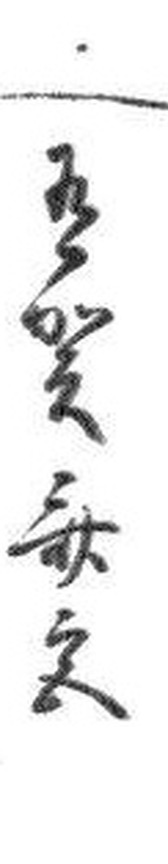有賀斎宮
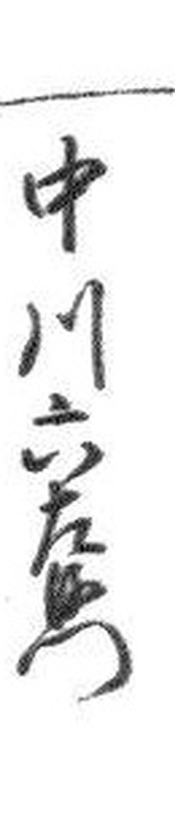中川六左衛門
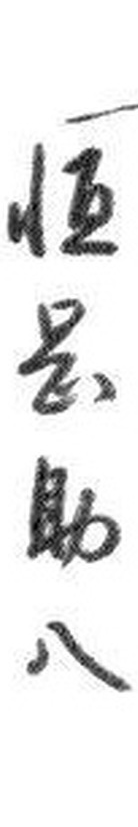恒岡助八

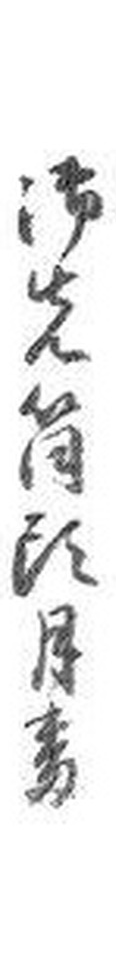御先筒頭月番
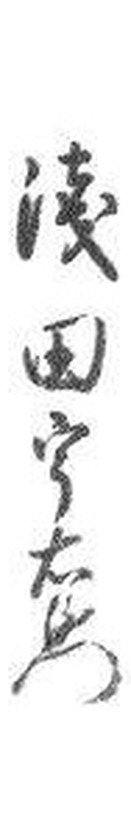浅田宇右衛門
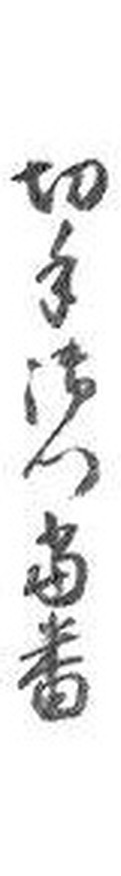切手御門当番
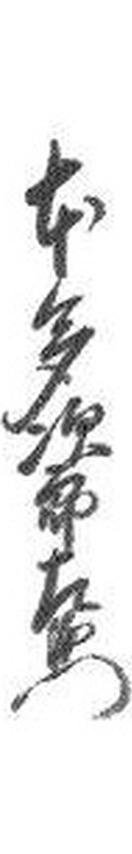本多次郎左衛門
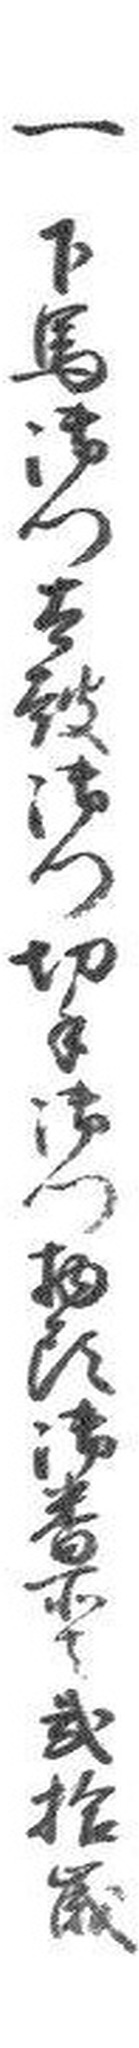一下馬御門太鼓御門切手御門物頭御番所者弐拾歳
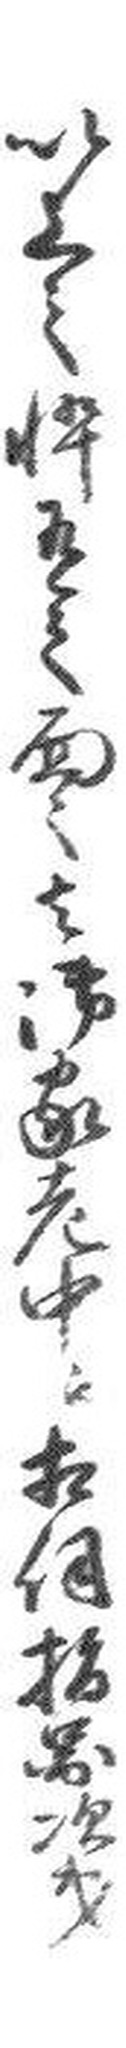以上之忰有之面々御家老中江相伺指図次第
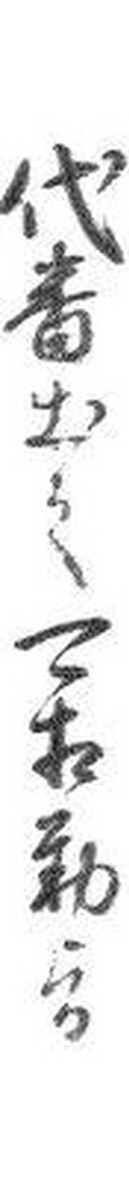代番出之可相勤旨
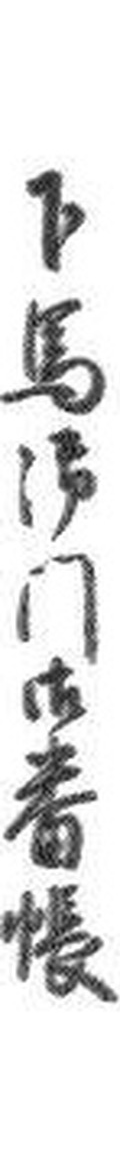下馬御門御番帳
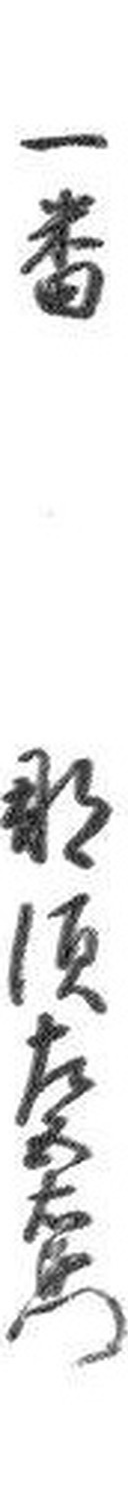一番那須左五右衛門
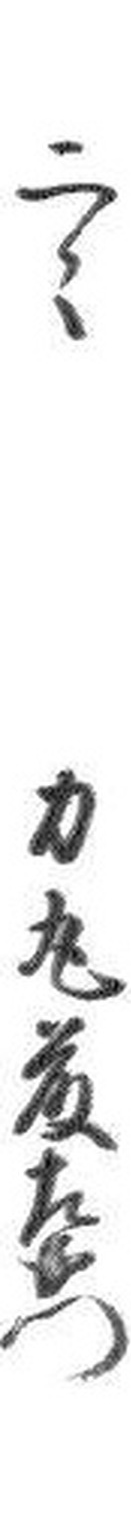二々力丸藤左衛門
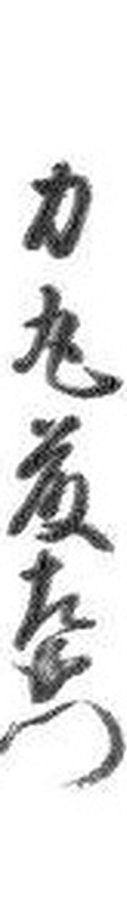二々力丸藤左衛門
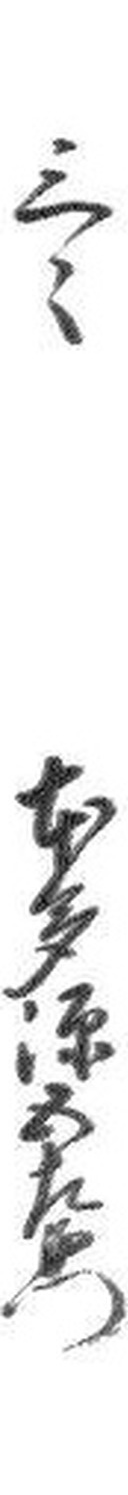三々本多源五左衛門
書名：家譜 十一 昌親公 従延宝二年到延宝四年八月
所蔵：福井県文書館 Fukui Prefectural Archives
